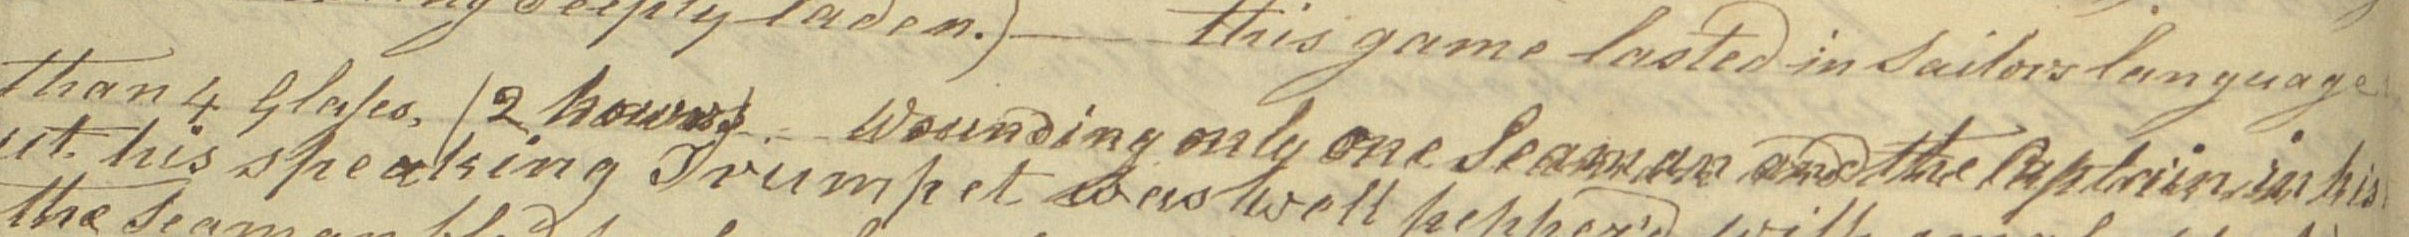than 4 Glasses, (2 howrs) Wounding only one Seaman and the Captain in his
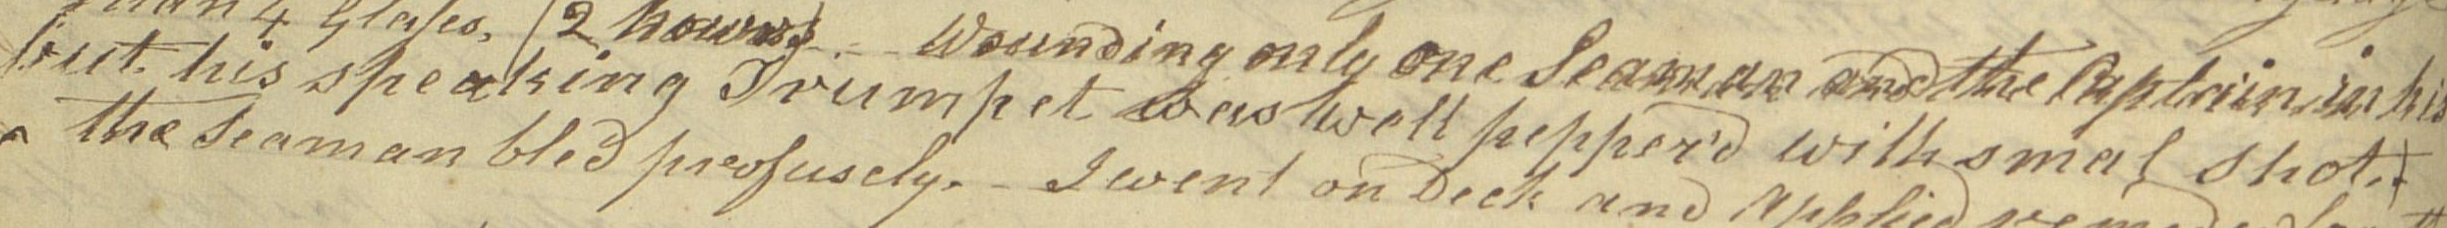but his speaking Trumpet was well pepper'd with smal shot.)
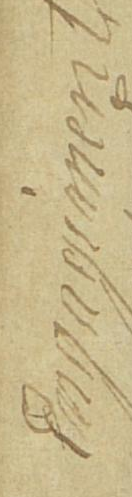Engagement
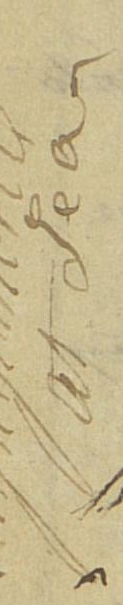at Sea
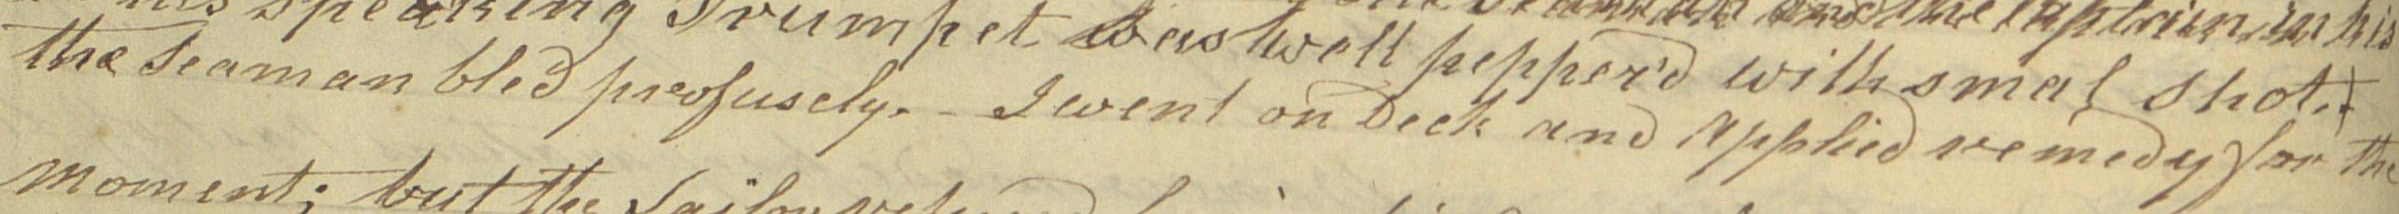the Seaman bled profusely. I went on Deck and applied remedy for the
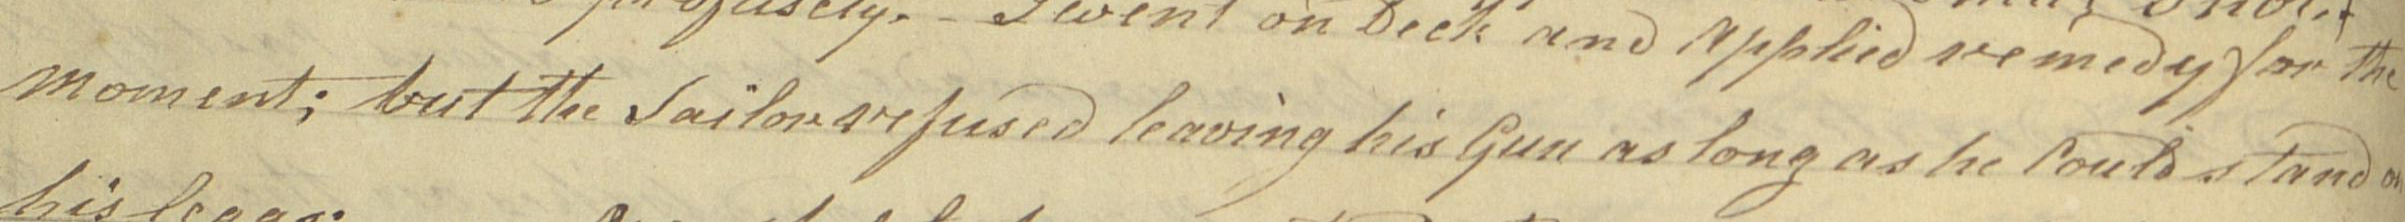moment; but the Sailor refused leaving his Gun as long as he could stand o-
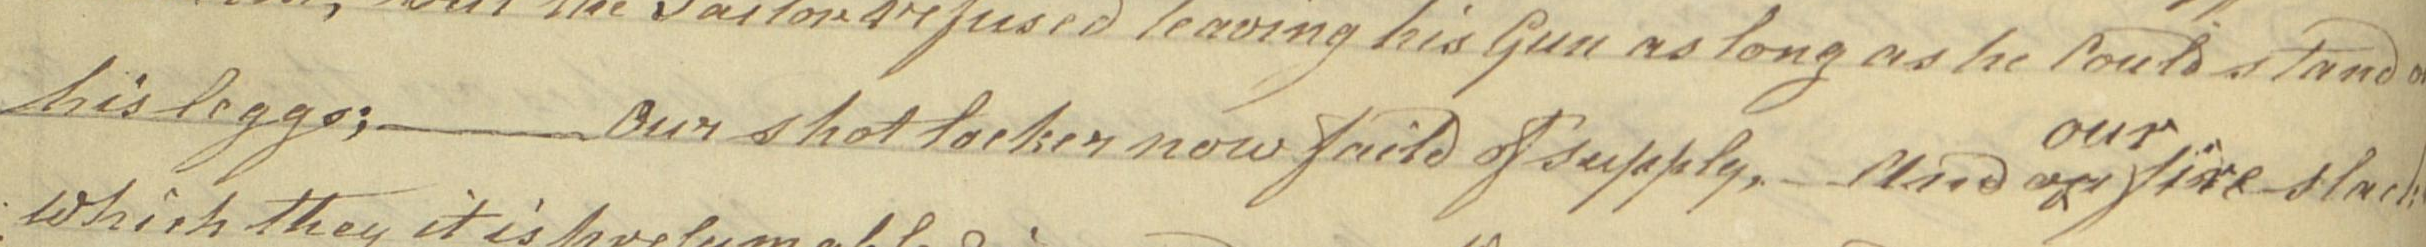his leggs; Our shot locker now faild of supply. And as ^ fire slack-
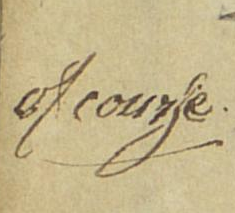of course
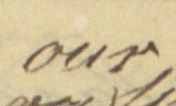our
